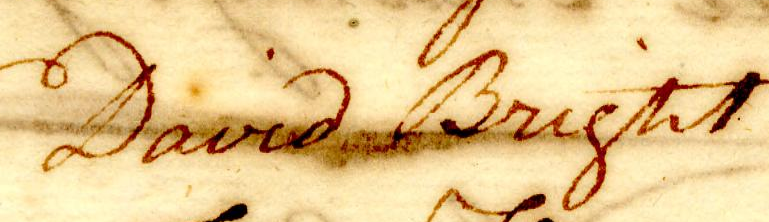David Bright
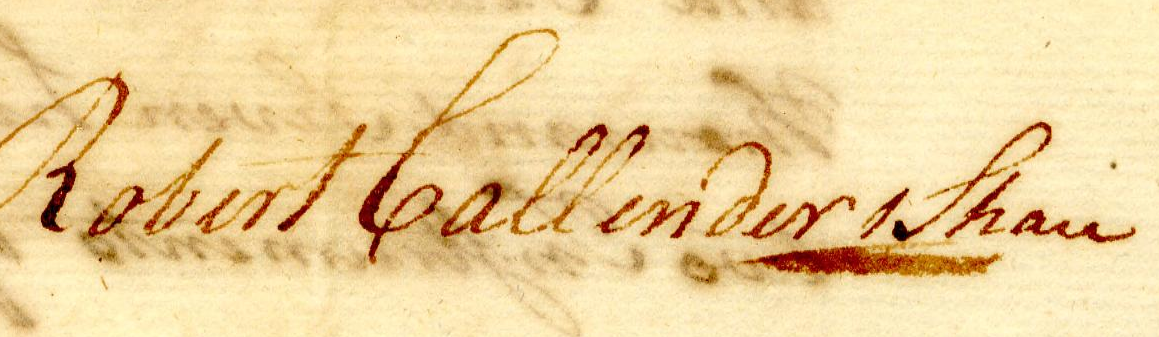Robert Callender 1 Share
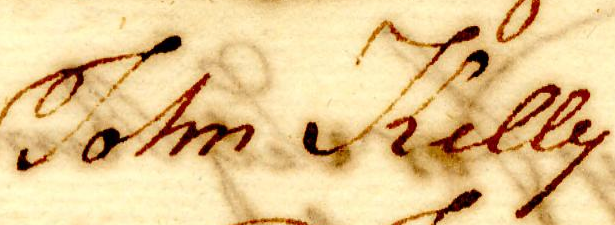John Kelly
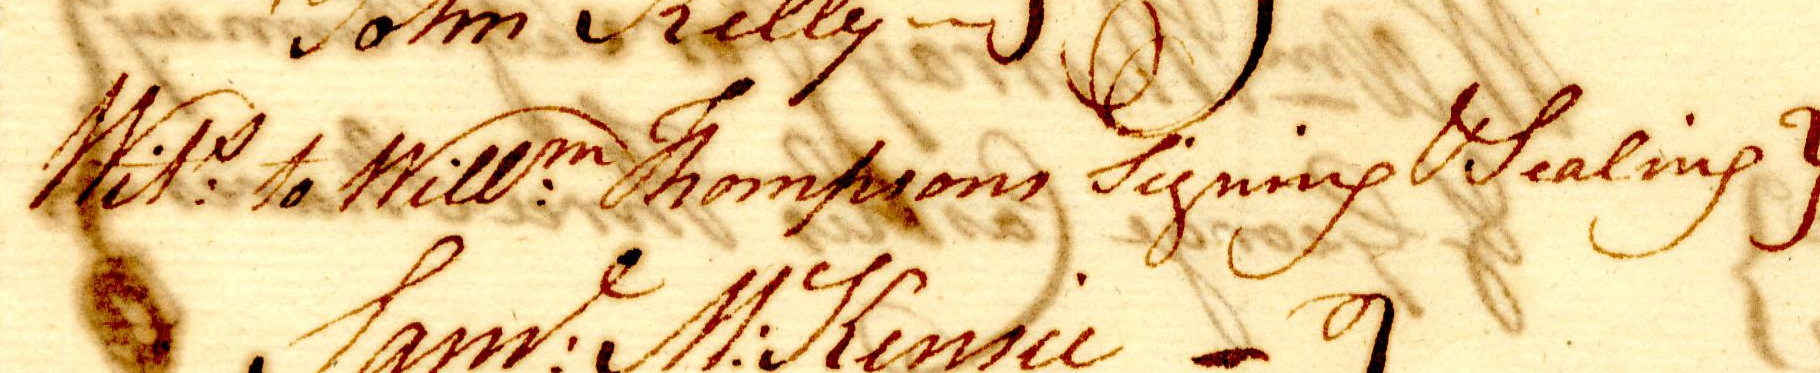Wit^s. to Will^m. Thompsons Signing & Sealing
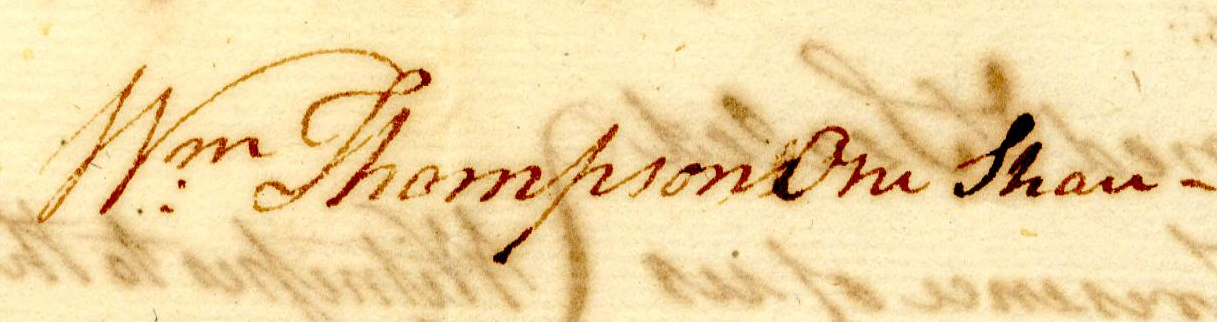W^m. Thompson One Shace
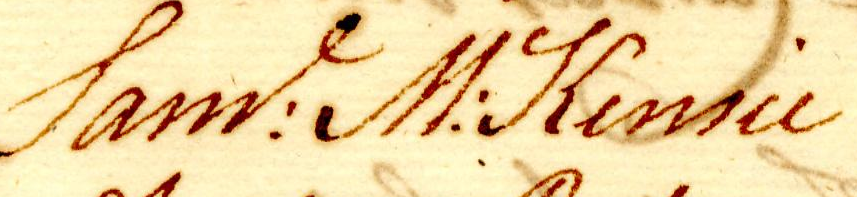Sam^l: MiKensie
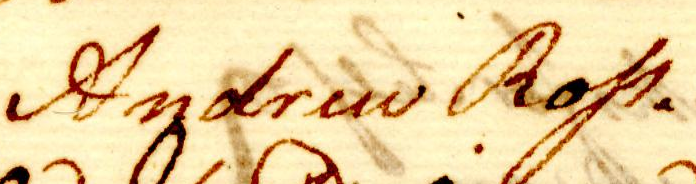Andrew Ross
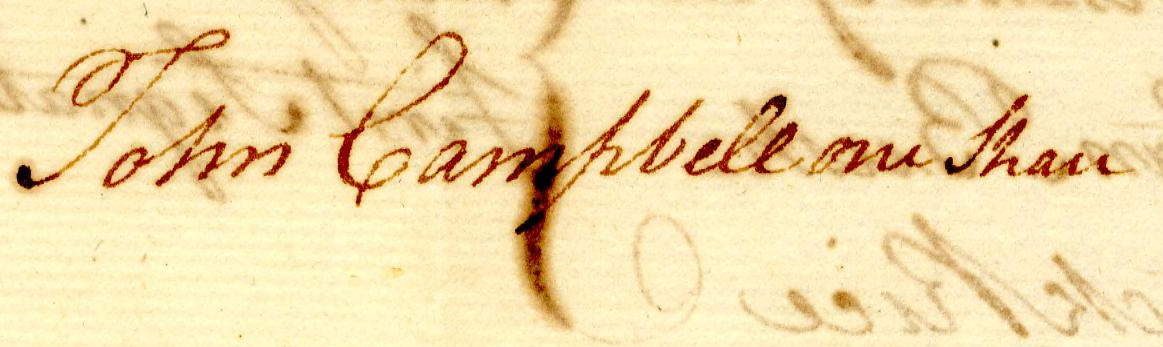John Campbell one share
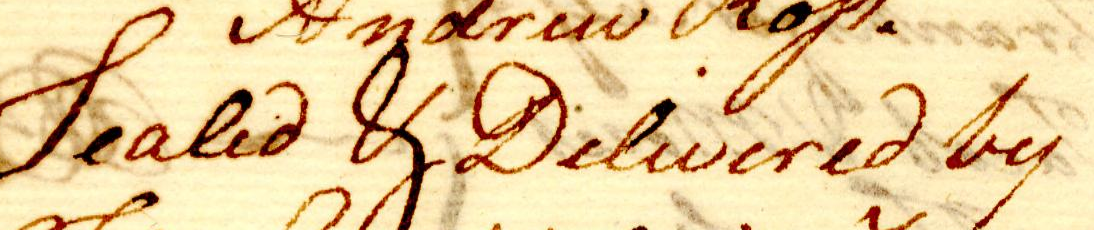Sealed & Delivered by
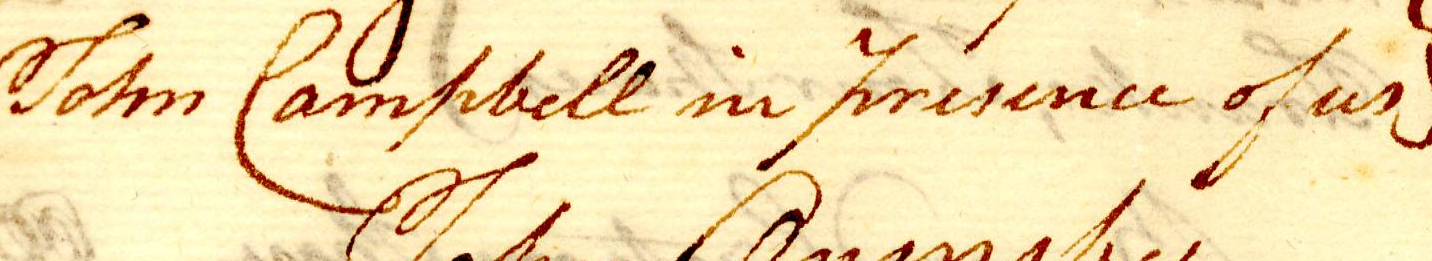John Campbell in presence of us
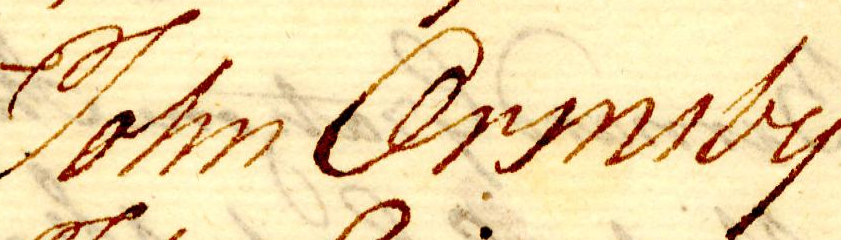John Ormsby
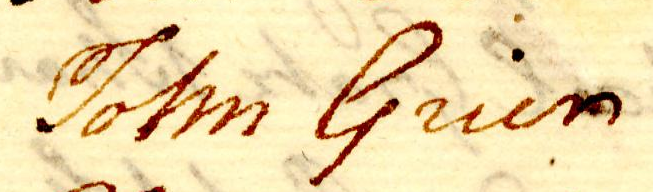John Grier
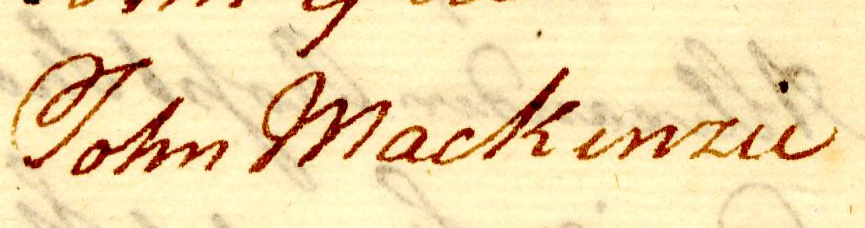John Mackenzie
